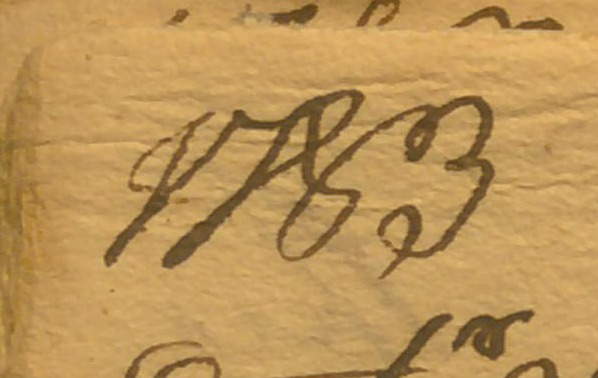1783
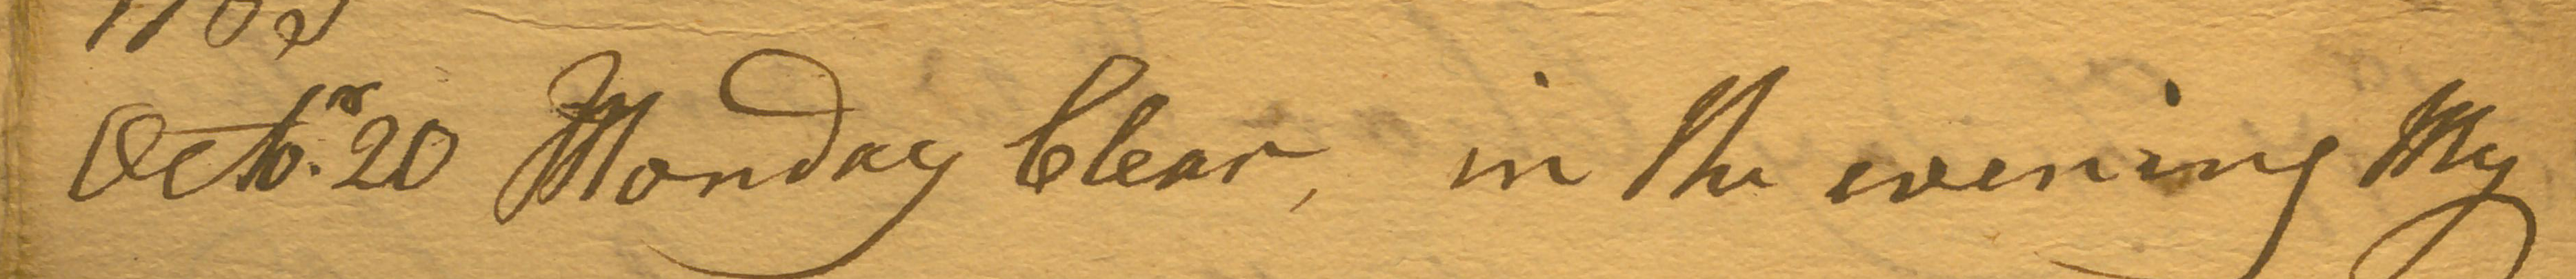Octo^r. 20 Monday Clear, in the evening My
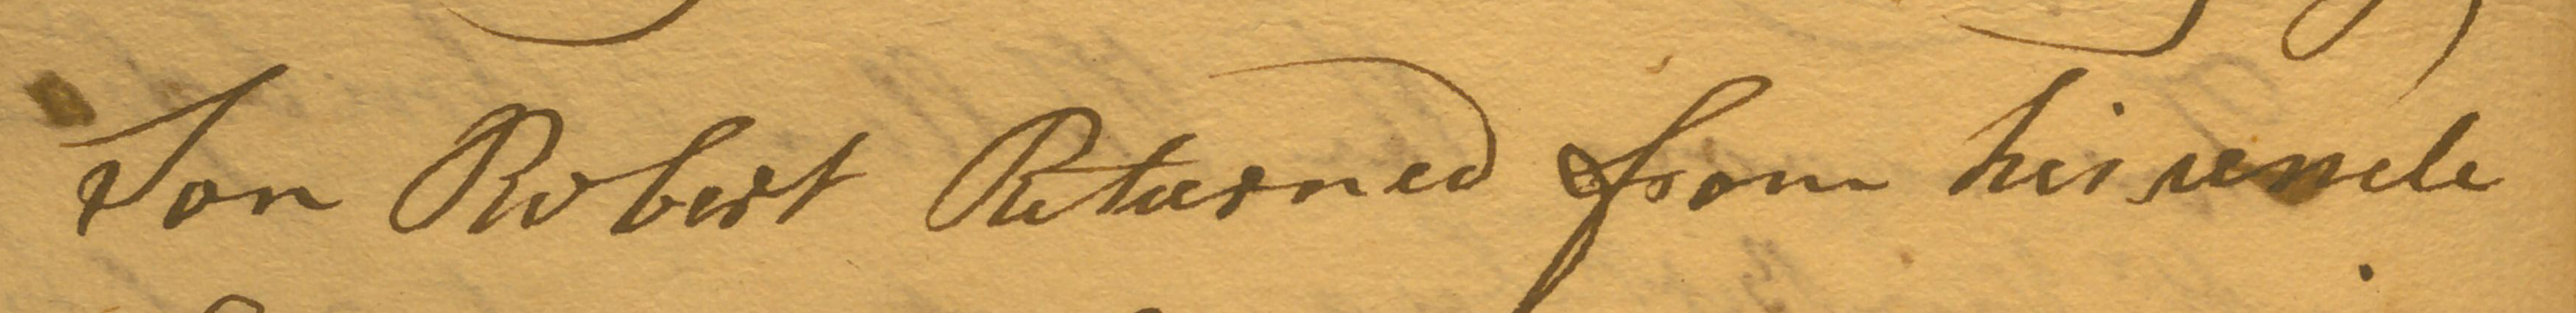Son Robert Returned from his uncle
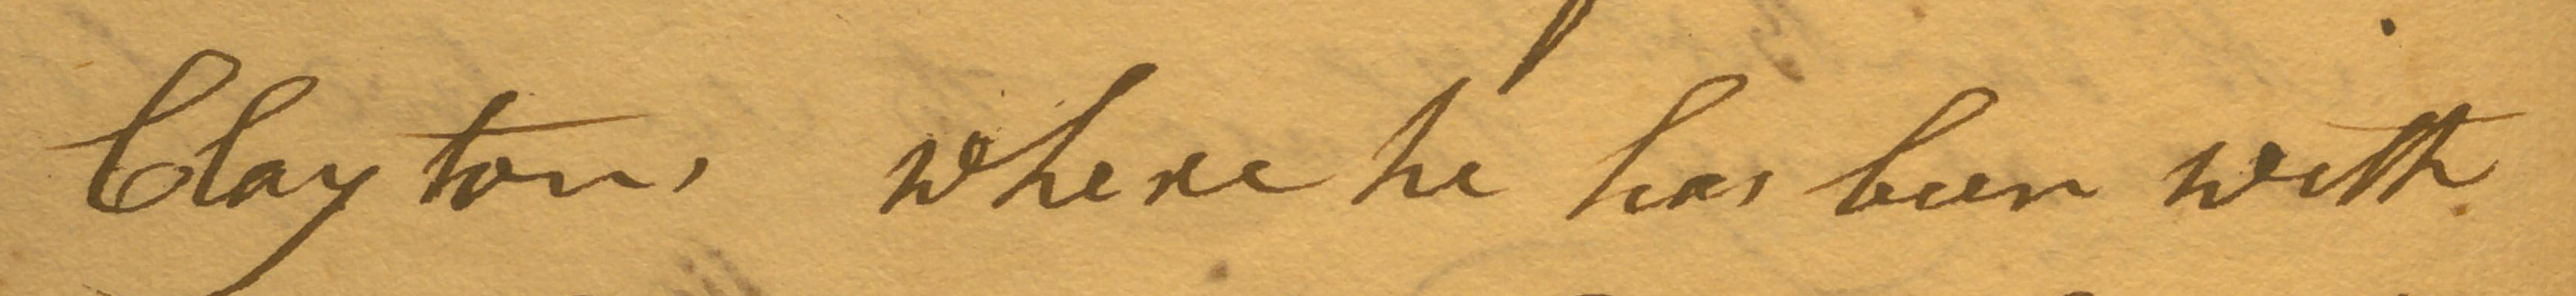Claytons where he has been with
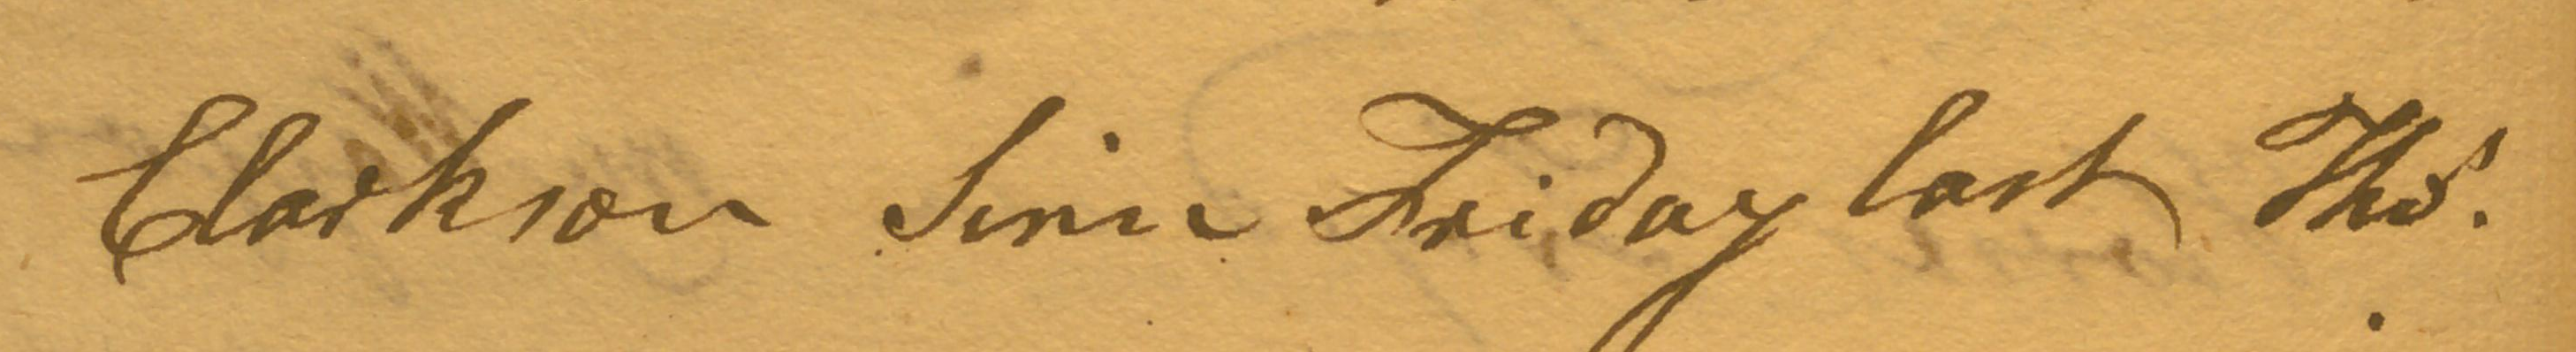Clarkson Since Friday last Tho^s.
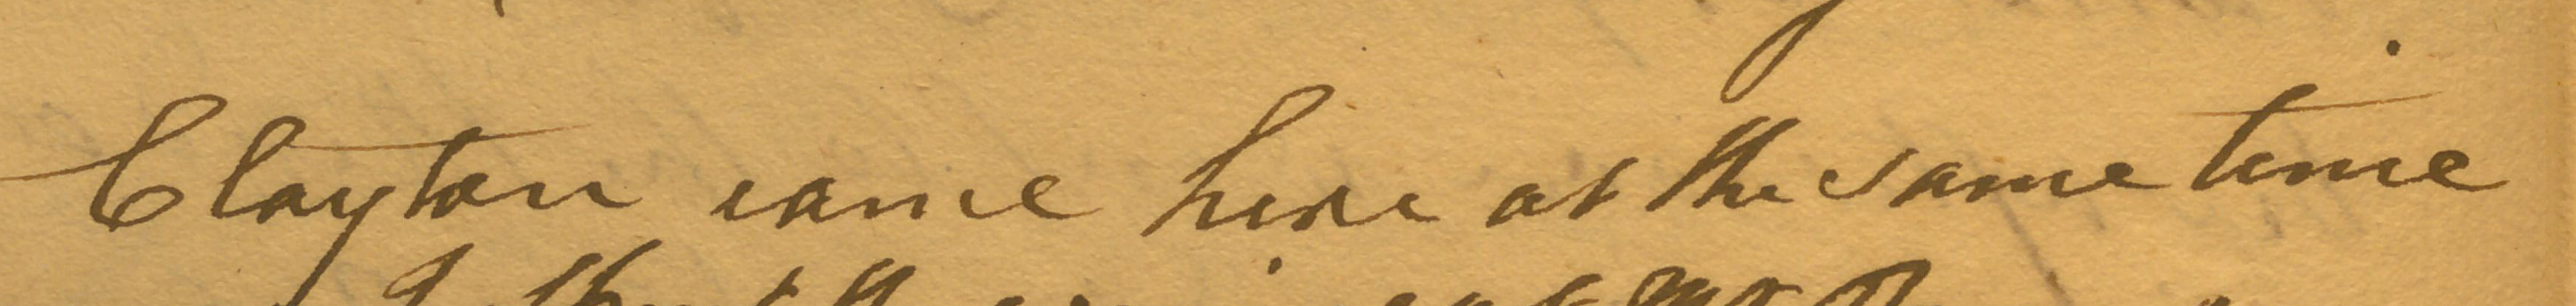Clayton came here at the same time
